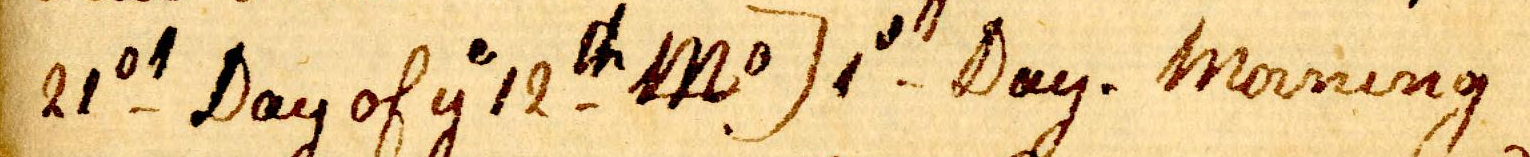21^st Day of y^e 12^th M^o ) 1^st Day- Morning
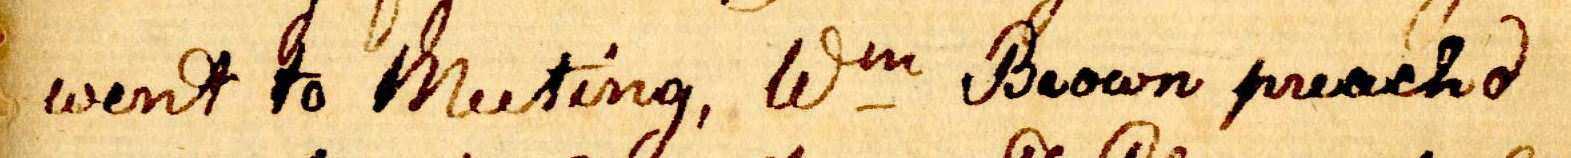went to Meeting, W^m Brown preachd
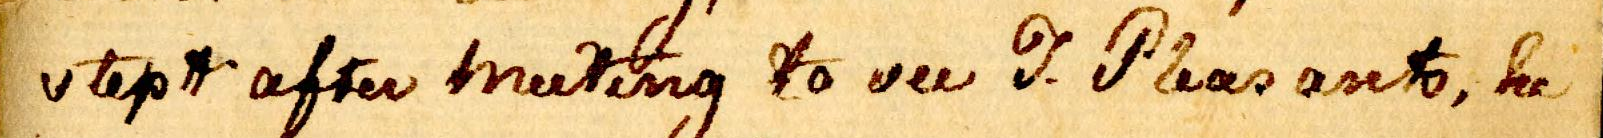stept after Meeting to see T. Pleasants, he
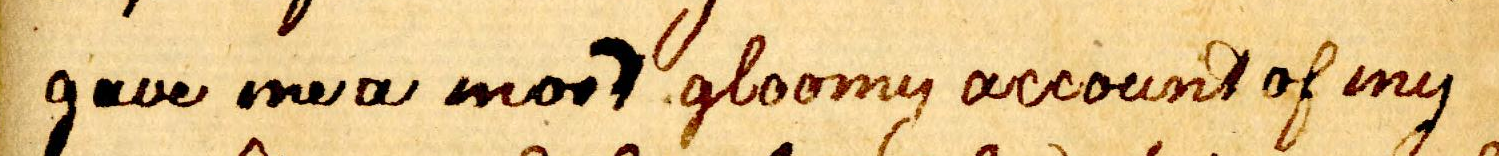gave me a most gloomy account of my
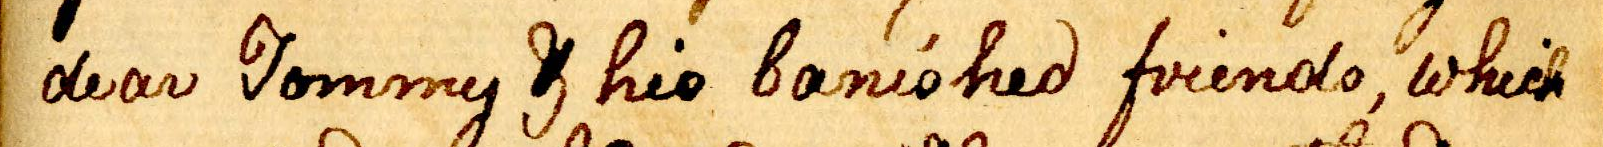dear Tommy & his banished friends, which
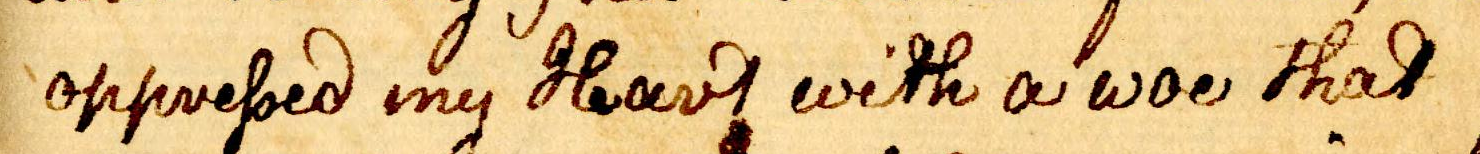oppressed my Heart with a woe that
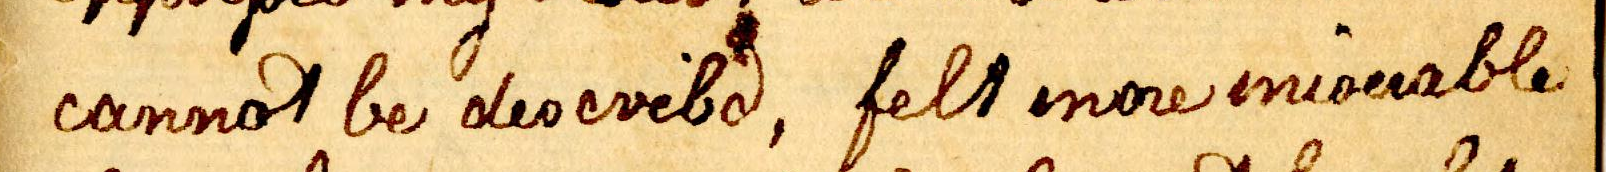cannot be describ'd, felt more miserable
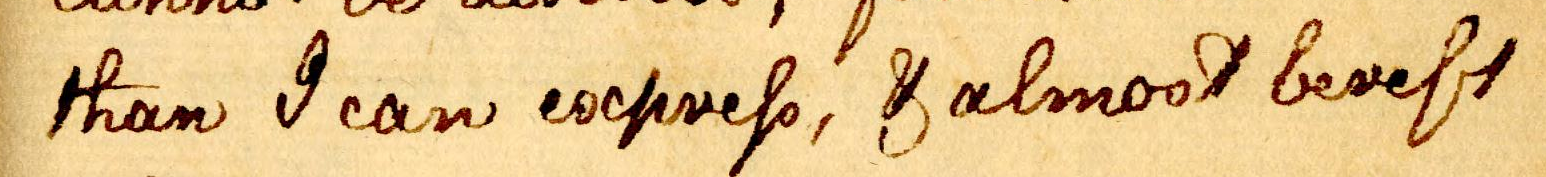than I can express, & almost bereft
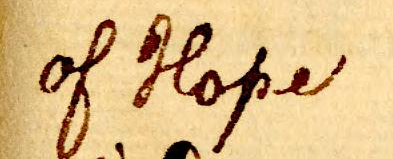of Hope
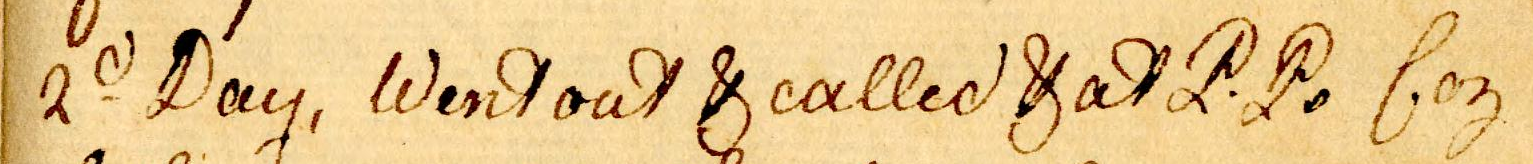2^d Day, Went out & called & at P. Ps Coz
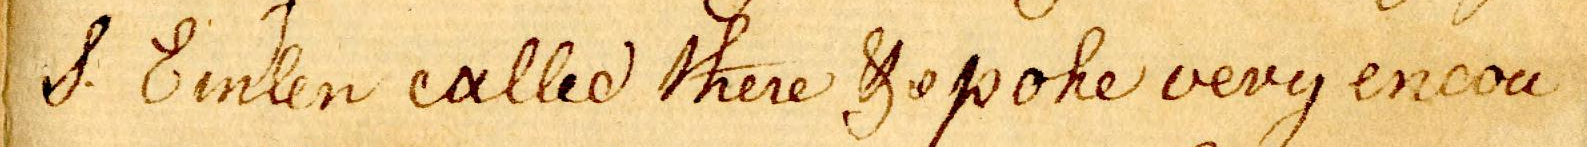S. Emlen called there & spoke very encou
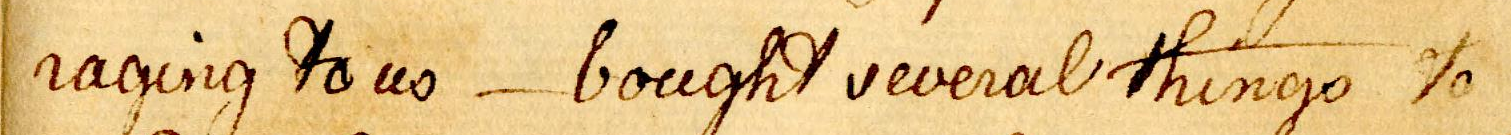raging to us- bought several things to
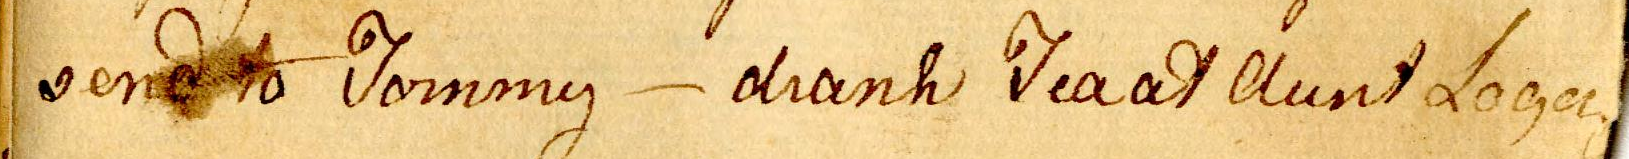send to Tommy- drank Tea at Aunt Loga
